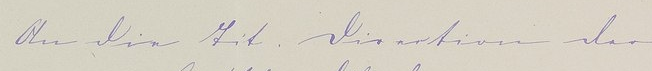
An die Tit. Direction der
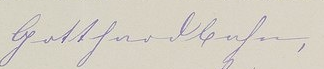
Gotthardbahn,
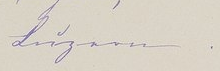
Luzern.
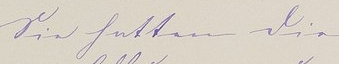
Sie hatten die
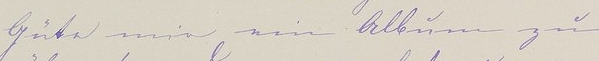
Güte mir ein Album zu
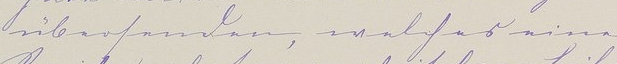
übersenden, welches eine
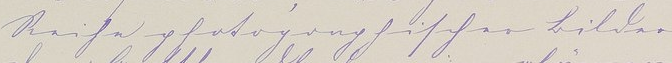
Reihe photographischer Bilder
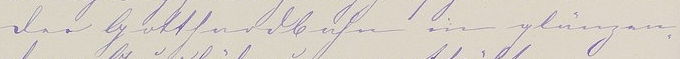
der Gotthardbahn in glänzen-
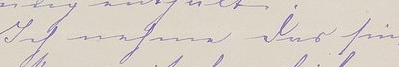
Ich nehme das sin-
